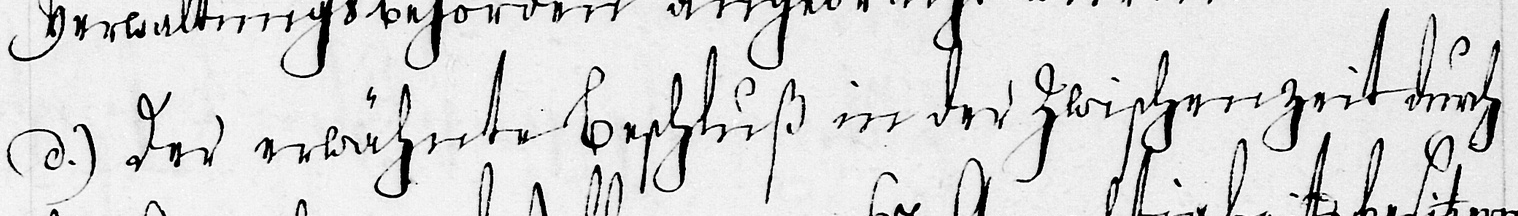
d.) Der erwähnte Beschluß in der Zwischenzeit durch
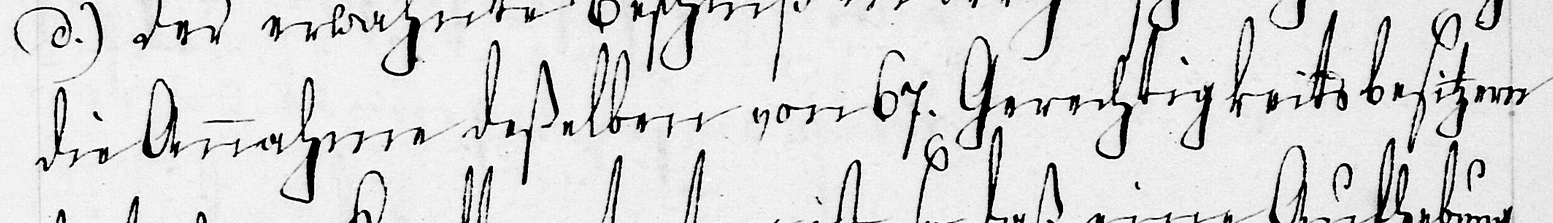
die Annahme deßelben von 67. Gerechtigkeitsbesitzern
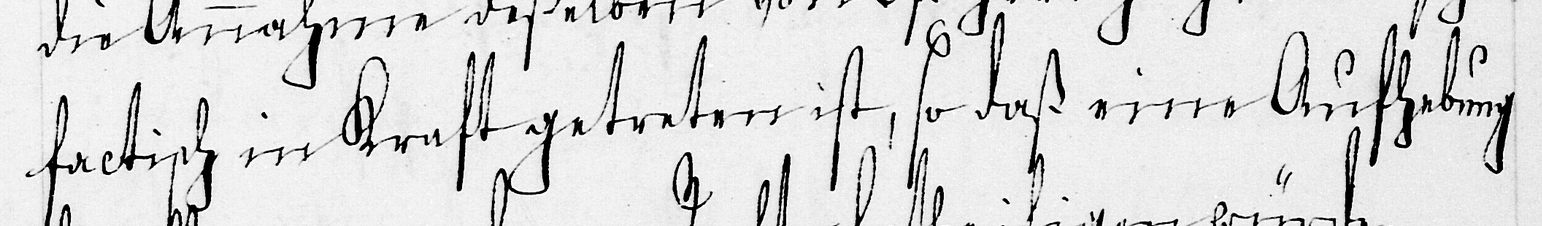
factisch in Kraft getreten ist, so daß eine Aufhebung
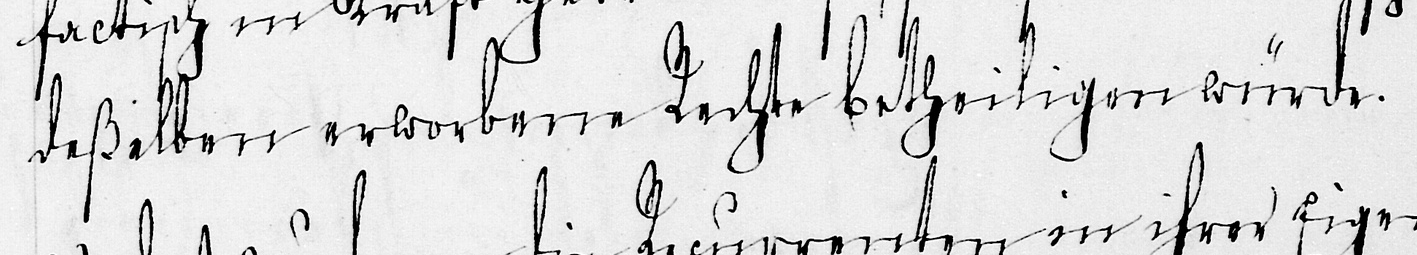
deßelben erworbene Rechte betheiligen würde.
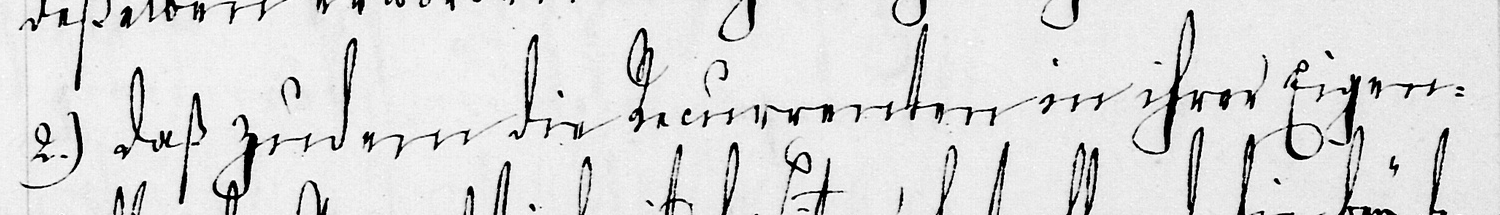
2.) Daß zudem die Recurrenten in ihrer Eigens¬
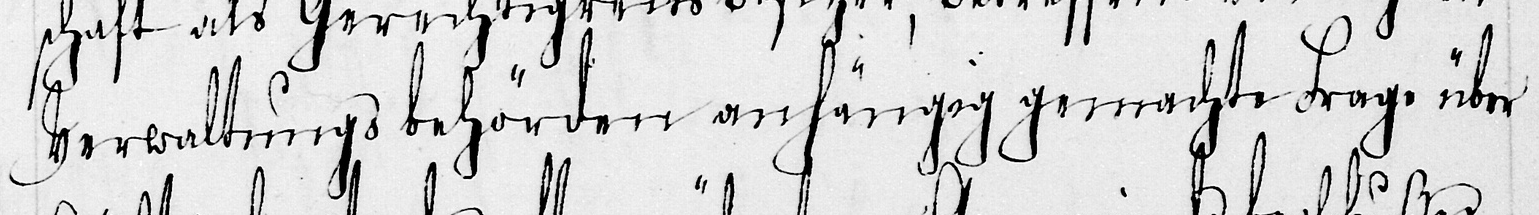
Verwaltungsbehörden anhängig gemachte Frage über
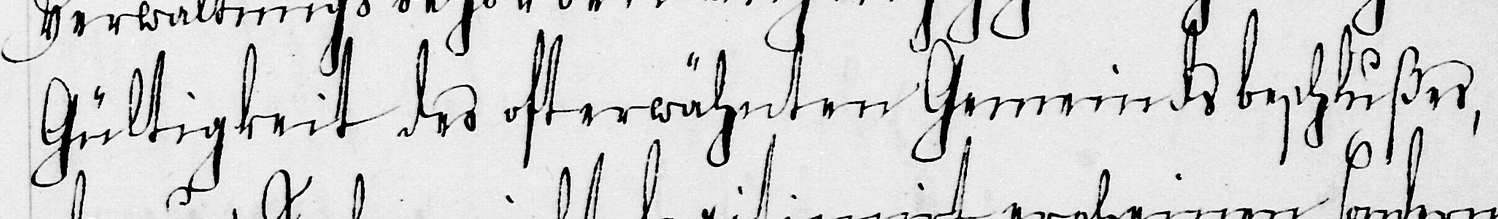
Gültigkeit des oft erwähnten Gemeindsbeschlußes,
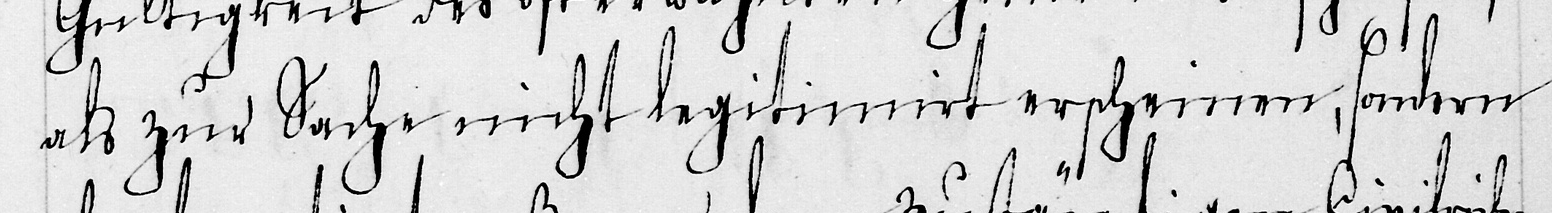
als zur Sache nicht legitimirt erscheinen, sondern
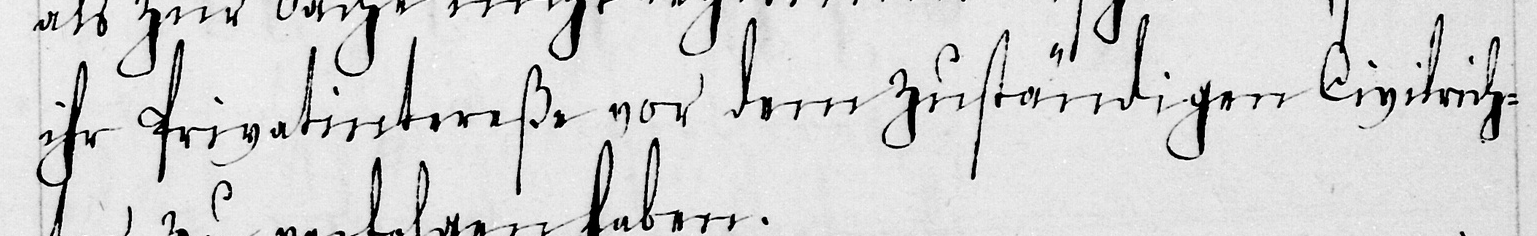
ihr Privatintereße vor dem zuständigen Civilrich¬
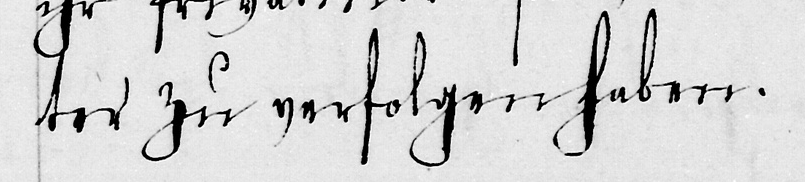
ter zu verfolgen haben.
